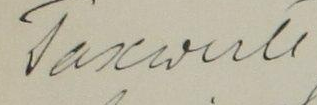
Taxwerte
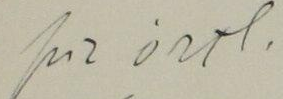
für örtl
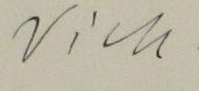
Vieh
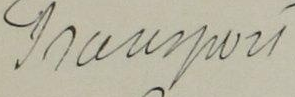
Transport
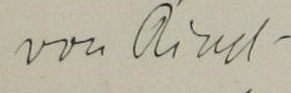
von Rind
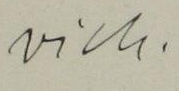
vieh
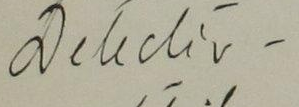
Detectiv-
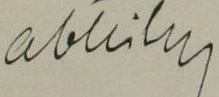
abteilung
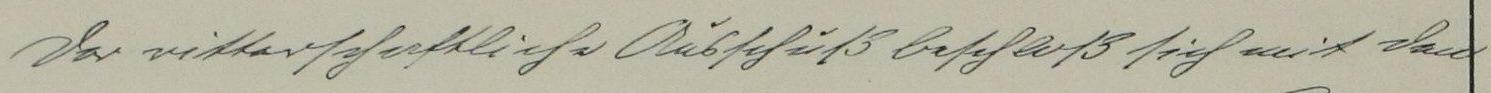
Der ritterschaftliche Ausschuß beschloß sich mit den
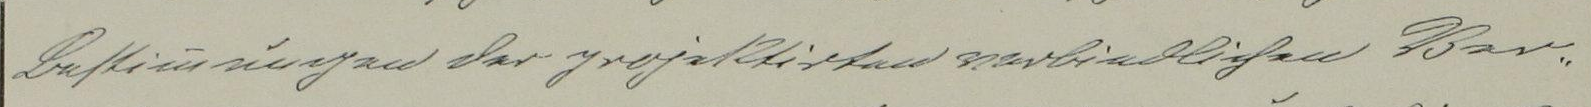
Bestimmungen der projektirten verbindlichen Ver-
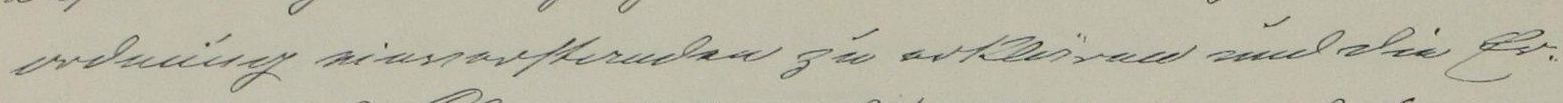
ordnung einverstanden zu erklären und die Er-
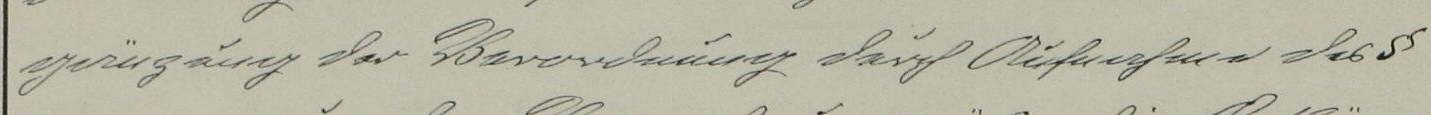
gänzung der Verordnung durch Aufnahme des §
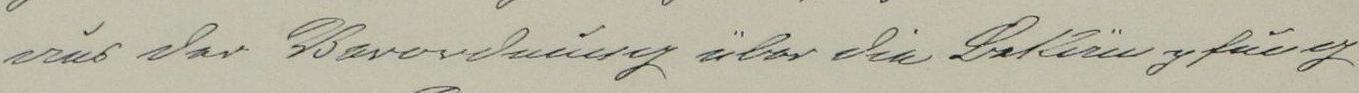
aus der Verordnung über die Bekämpfung
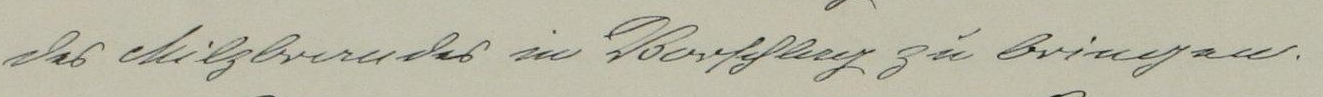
des Milzbrandes in Vorschlag zu bringen.
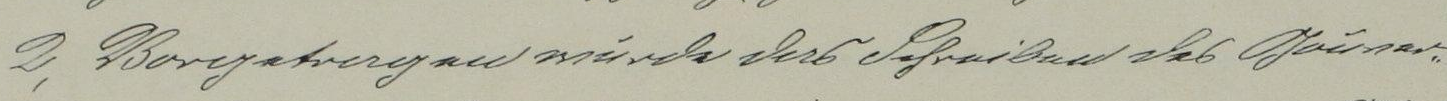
2. Vorgetragen wurde das Schreiben des Gouver-
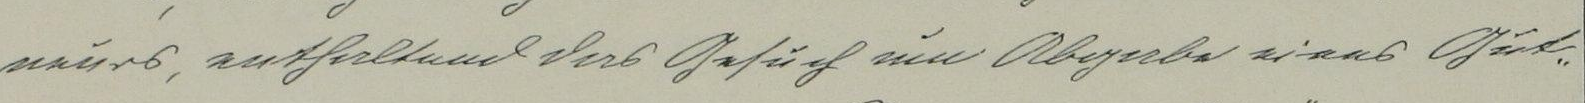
neurs, enthaltend das Gesuch um Abgabe eines Gut-
